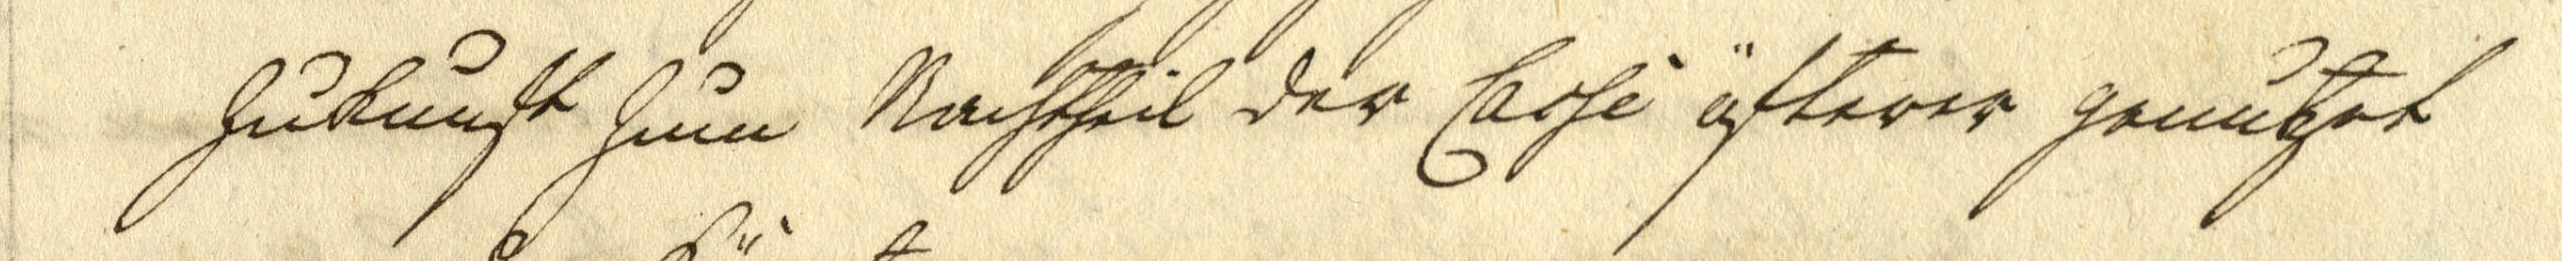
Zukunft zum Nachtheil der Casse öfterer genutzet
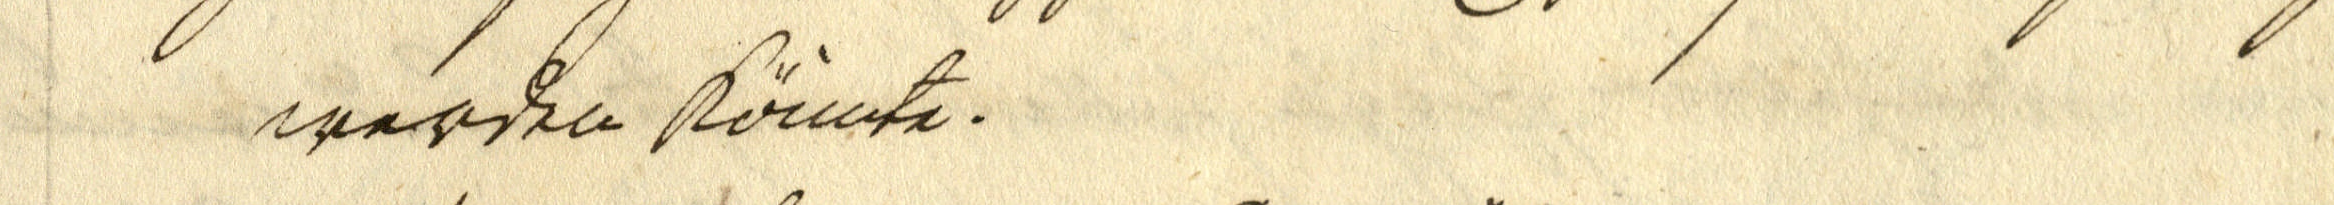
werden könnte.
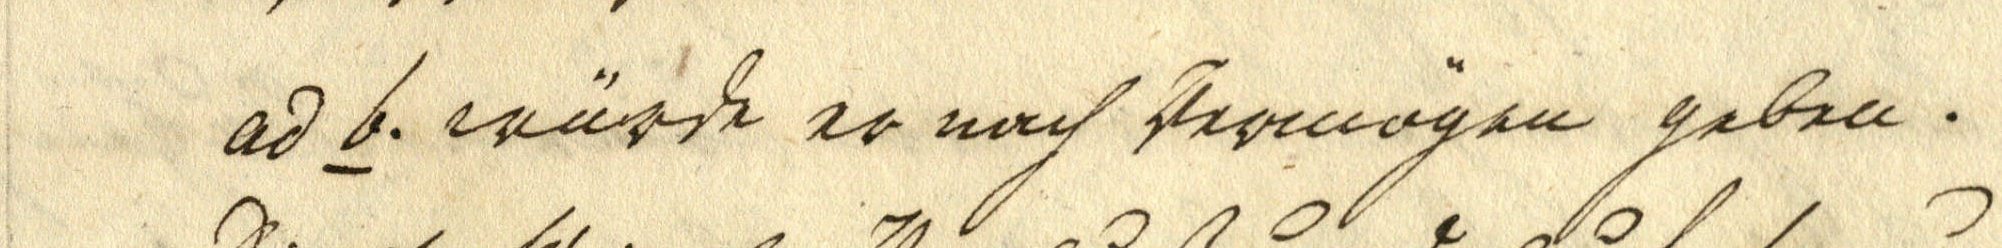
ad b. würde er nach Vermögen geben.
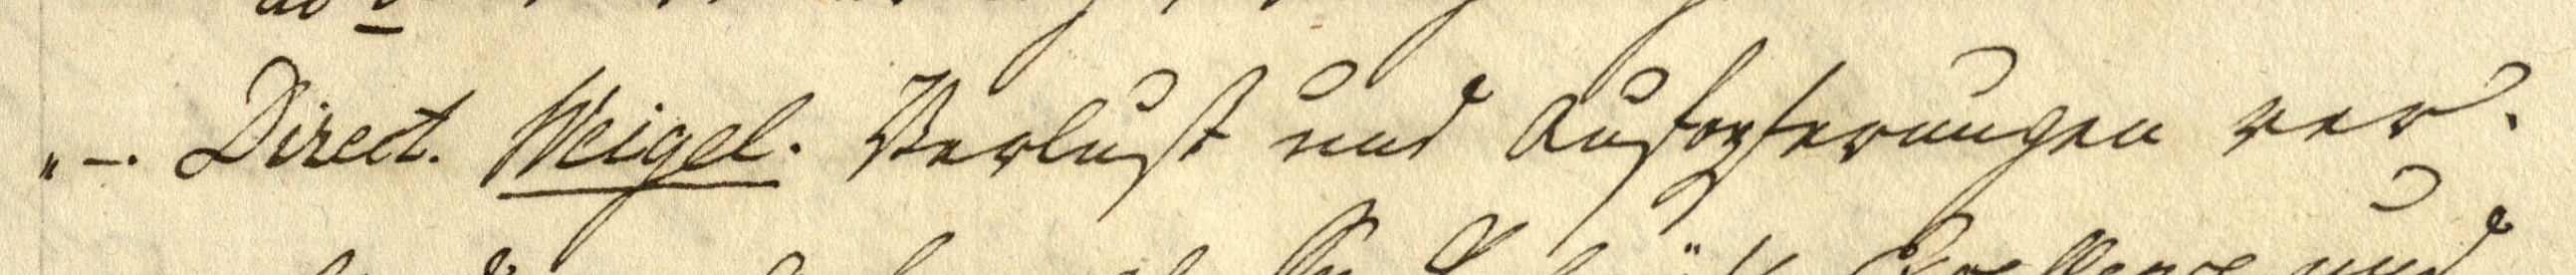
" -. Direct. Weigel. Verlust und Aufopferungen ver-
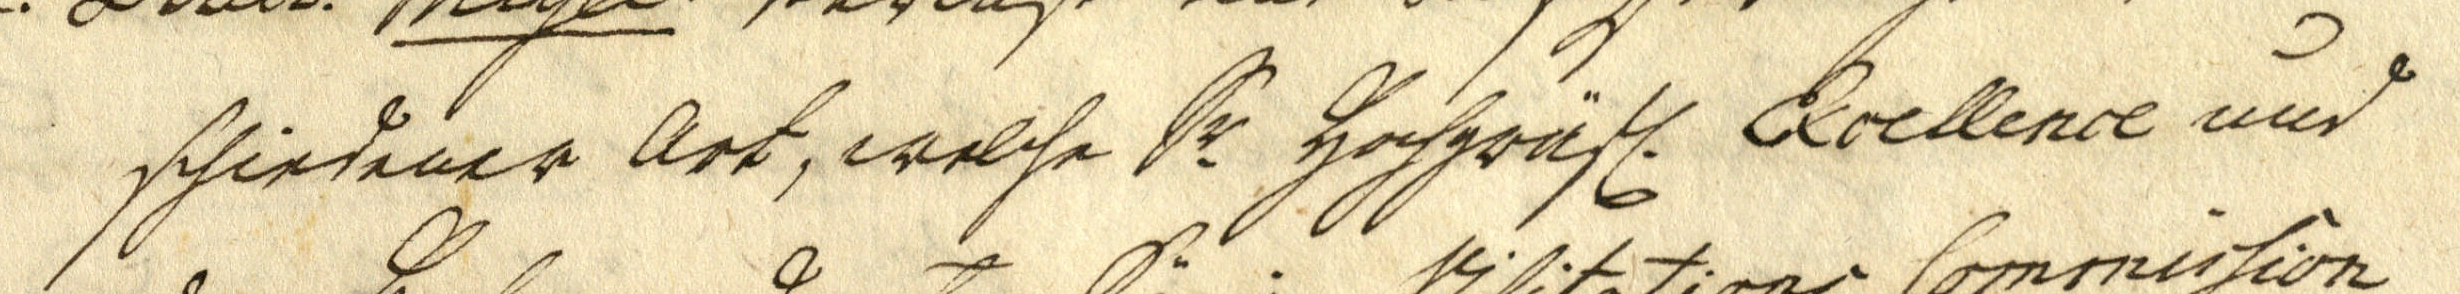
schiedener Art, welche Sr. Hochgräfl. Excellence und
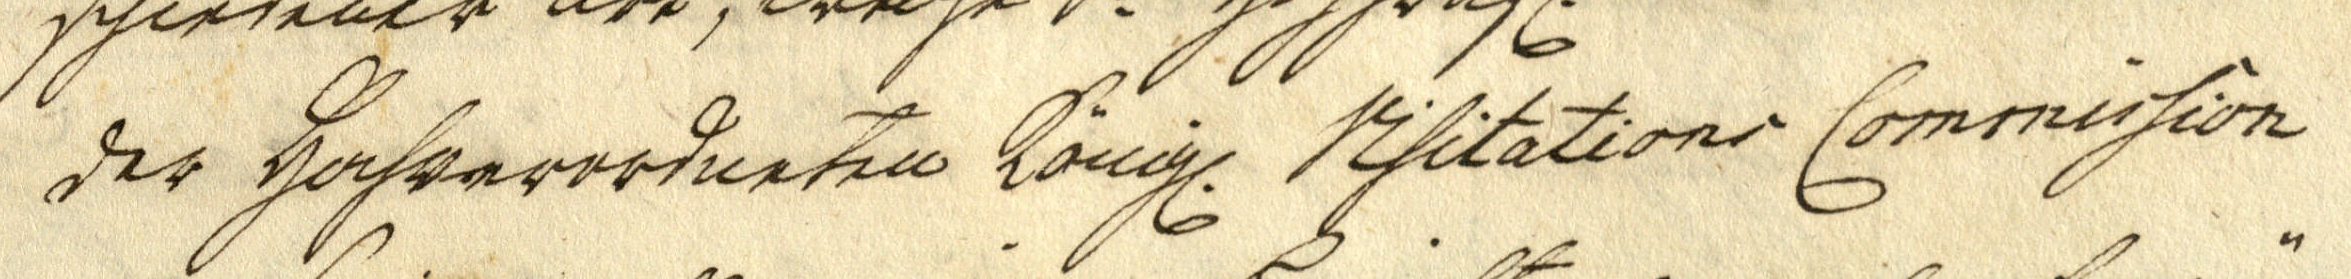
der Hochverordneten Königl. Visitations Commission
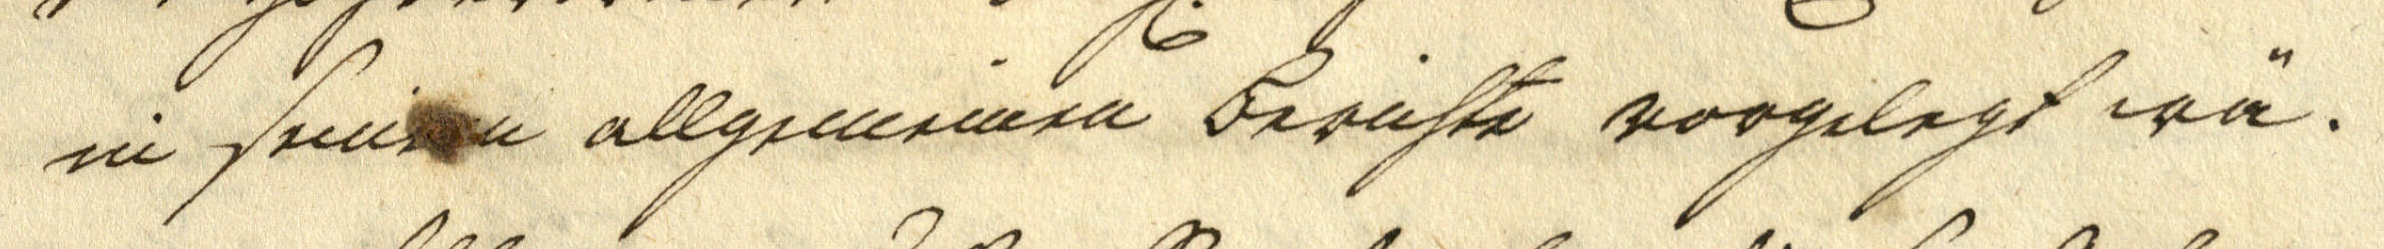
in seinem allgemeinen Berichte vorgelegt wä-
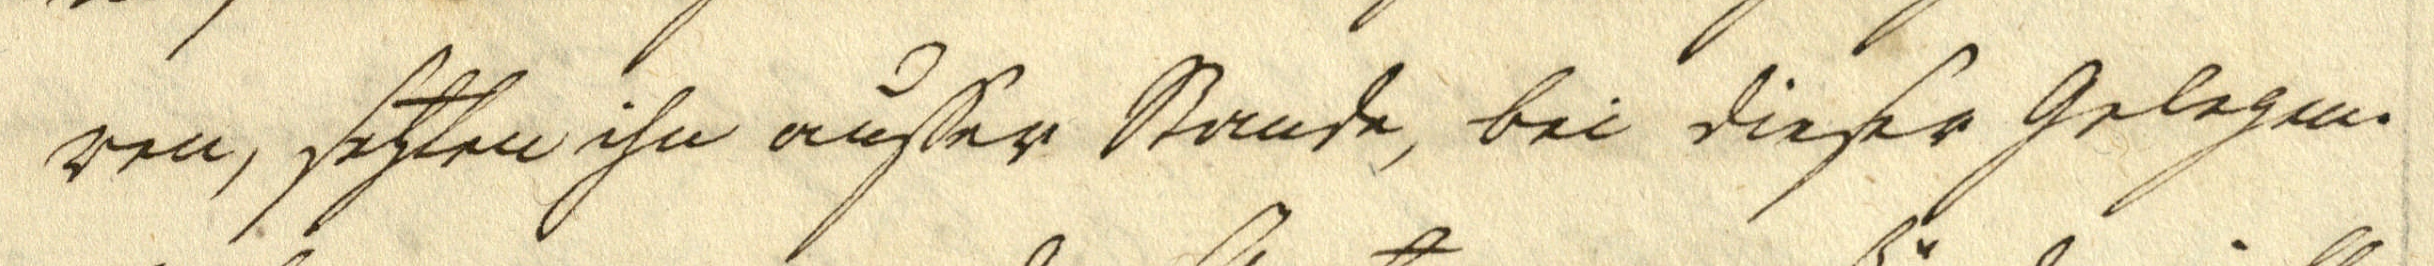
ren, setzten ihn ausser Stande, bei dieser Gelegen-
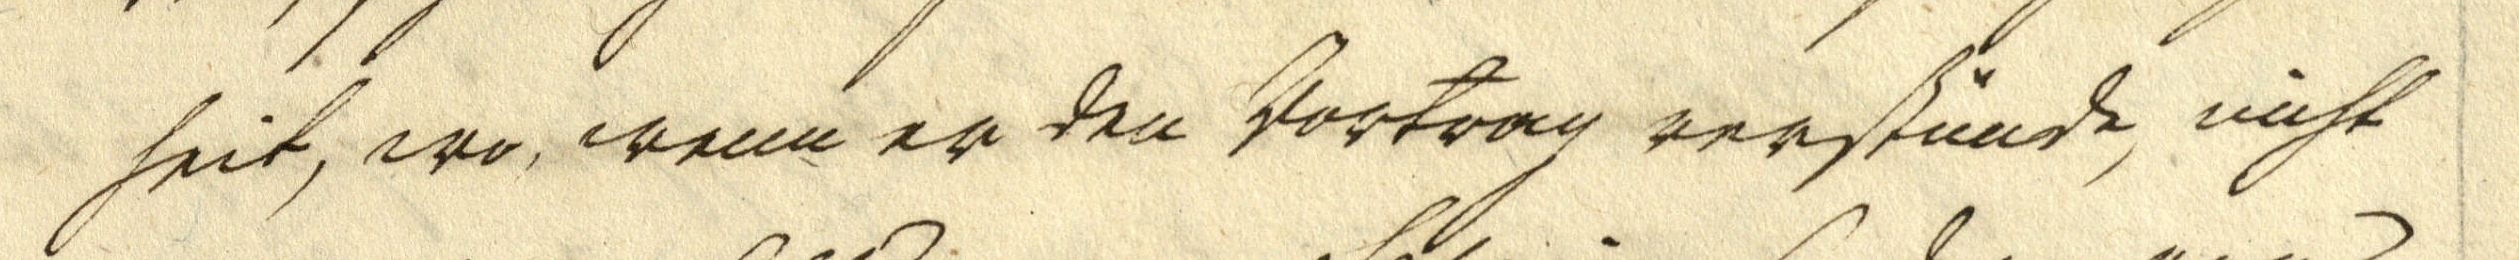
heit, wo, wenn er den Vortrag verstünde, nicht
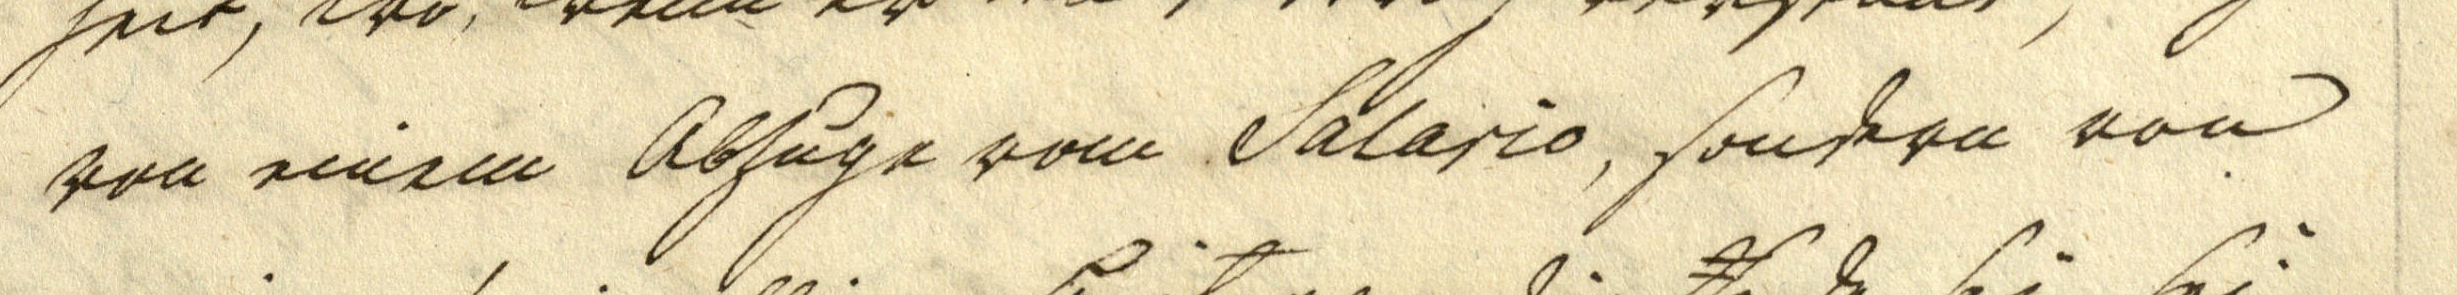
von einem Abzuge vom Salario, sondern von
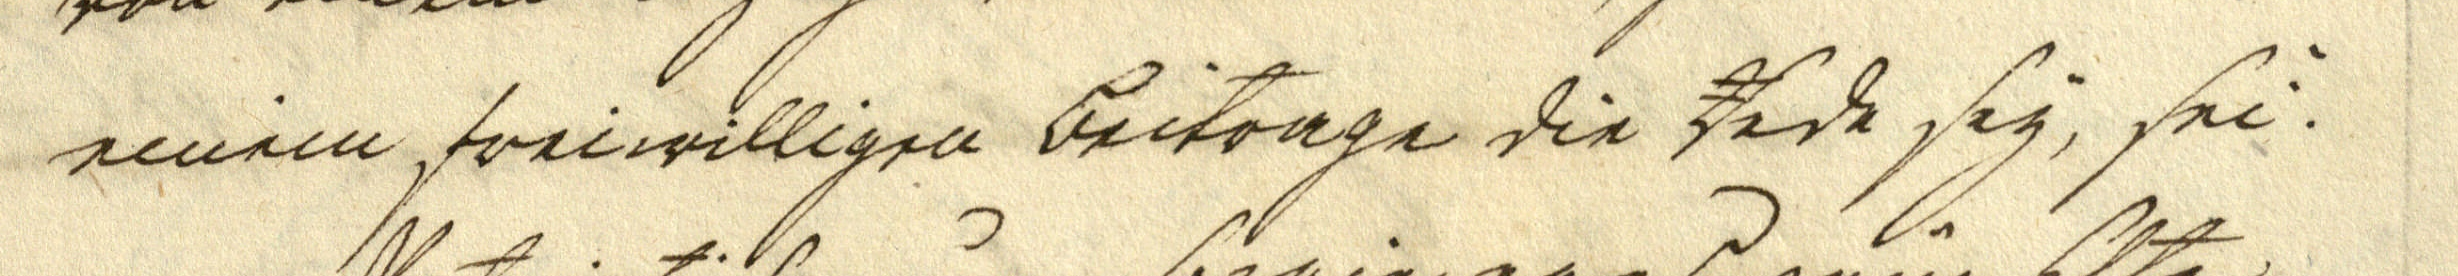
einem freiwilligen Beitrage die Rede sey, sei-
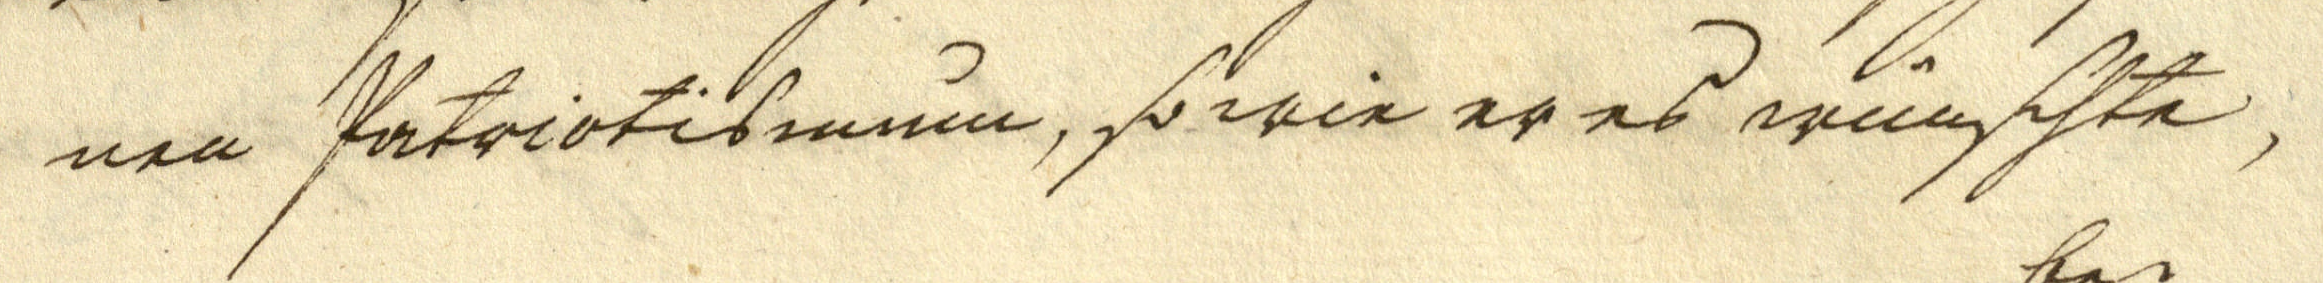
nen Patriotismum, so wie er es wünschte,
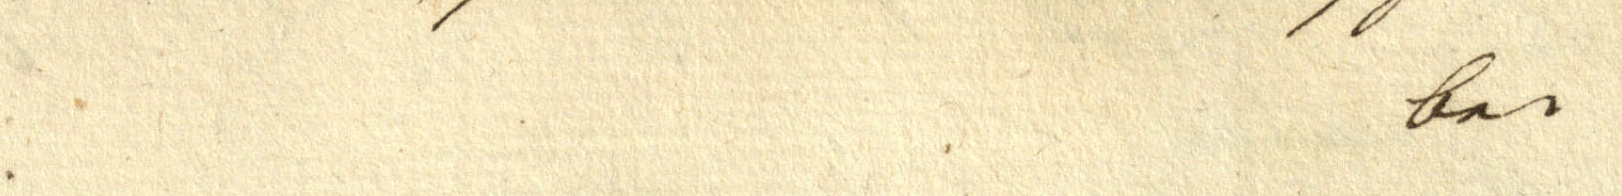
be-
